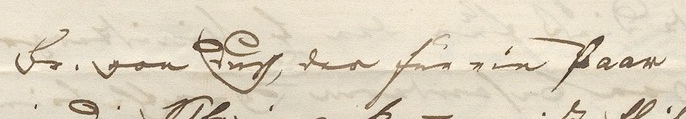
Hr. von Dusch, der für ein Paar
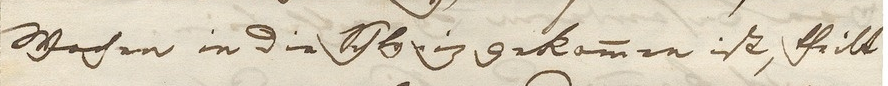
Wochen in die Schweiz gekommen ist, theilt
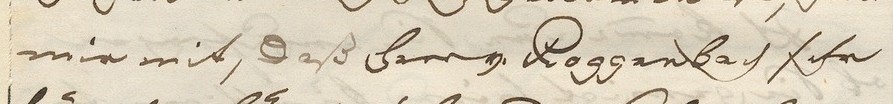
mir mit, daß Herr v. Roggenbach sehr
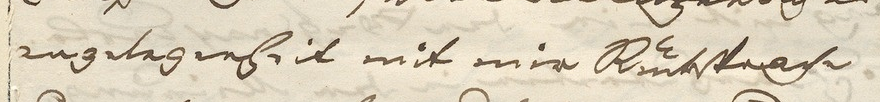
angelegenheit mit mir Rücksprache
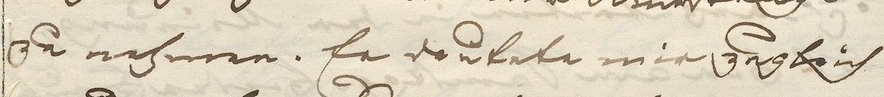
zu nehmen. Er deutete mir zugleich
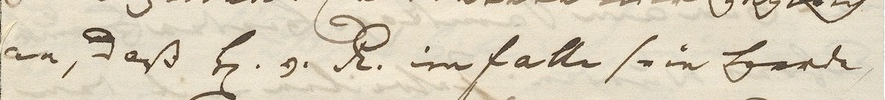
an, daß Hr. v. R. im Falle sein werde
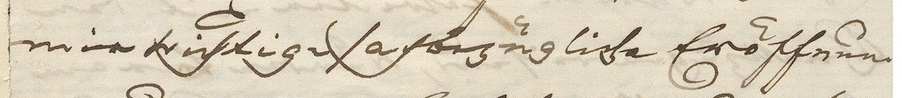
mir wichtige sachbezügliche Eröffnun-
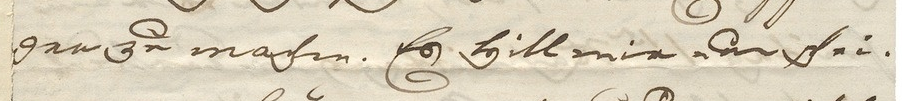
gen zu machen. Es will mir nun schei-
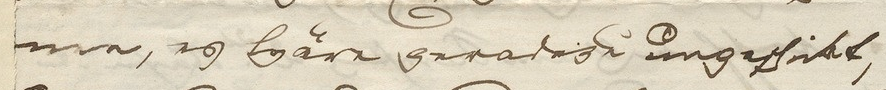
nen, es wäre geradezu ungeschickt,
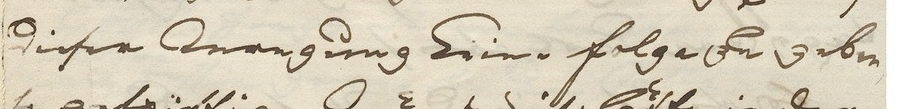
dieser Anregung keine Folge zu geben,
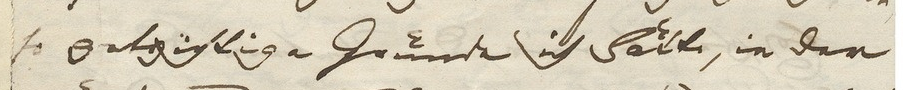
so gewichtige Gründe ich hätte, in der
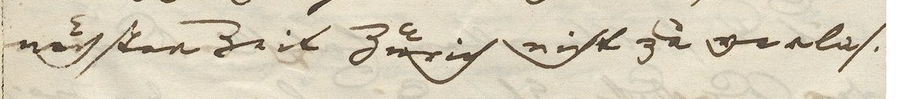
nächsten Zeit Zürich nicht zu verlas-
